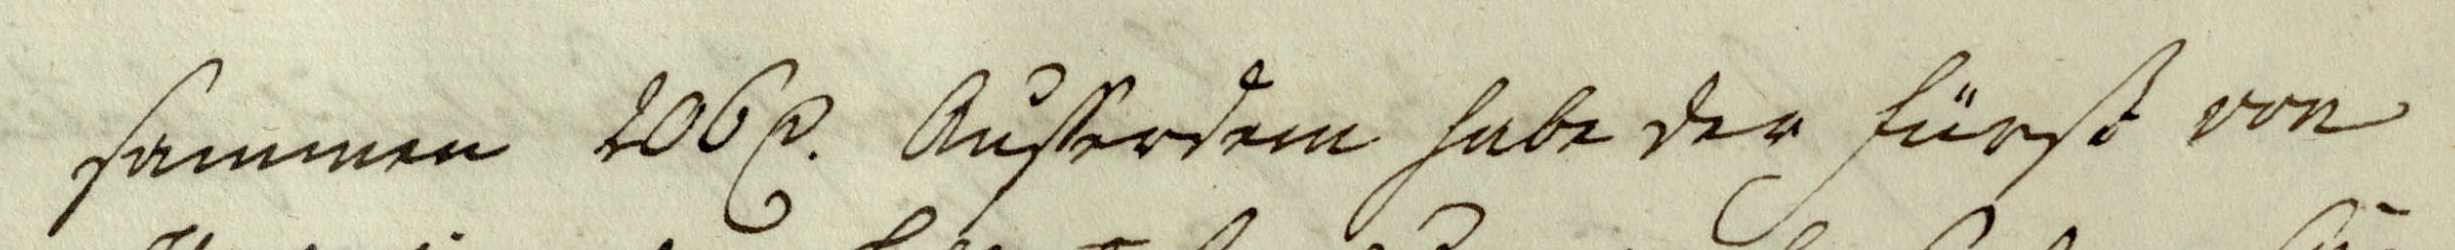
sammen 200 rtl. Ausserdem habe der Fürst von
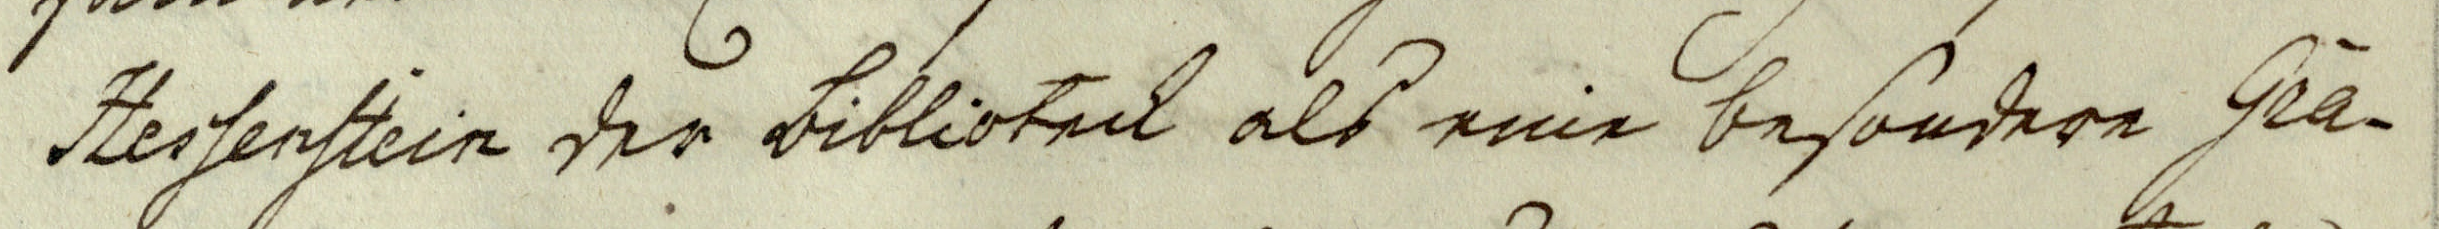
Hechenstein der Bibliotek als eine besondere Gra¬
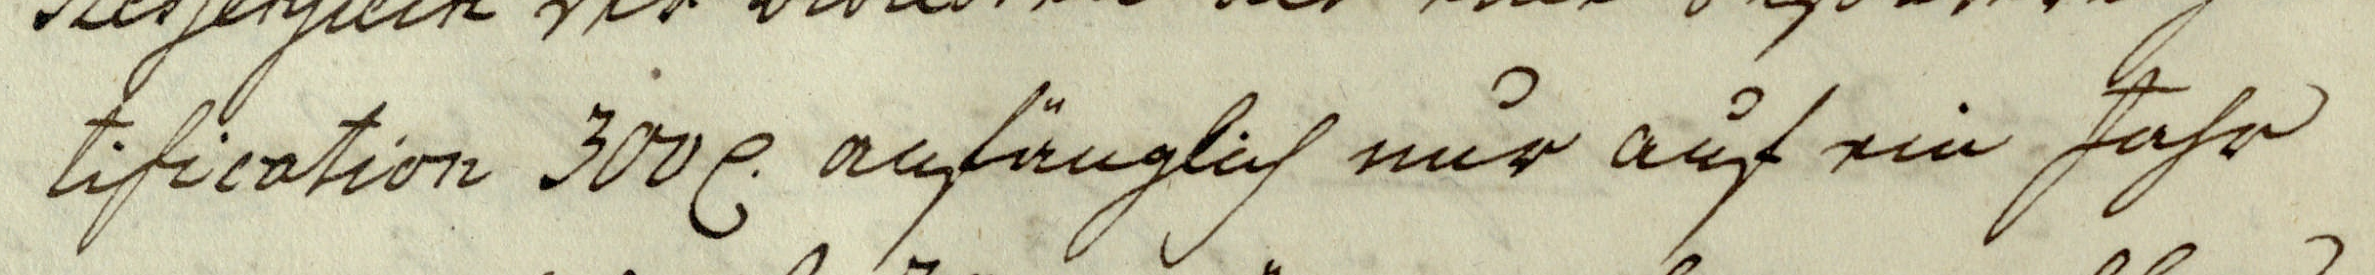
tification 300 rtl. anfänglich nur auf ein Jahr
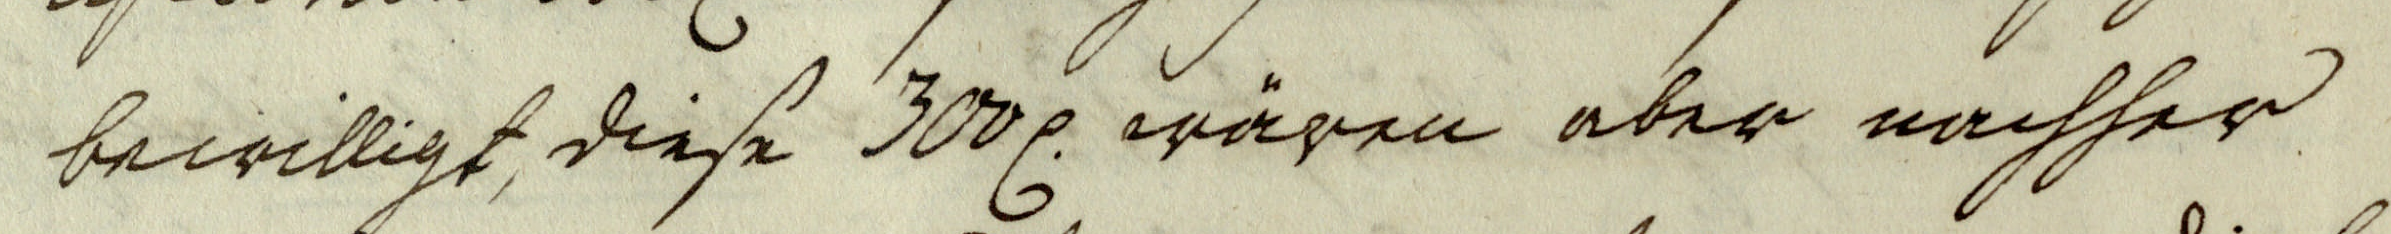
bewilligt, diese 300 rtl. wären aber nachher
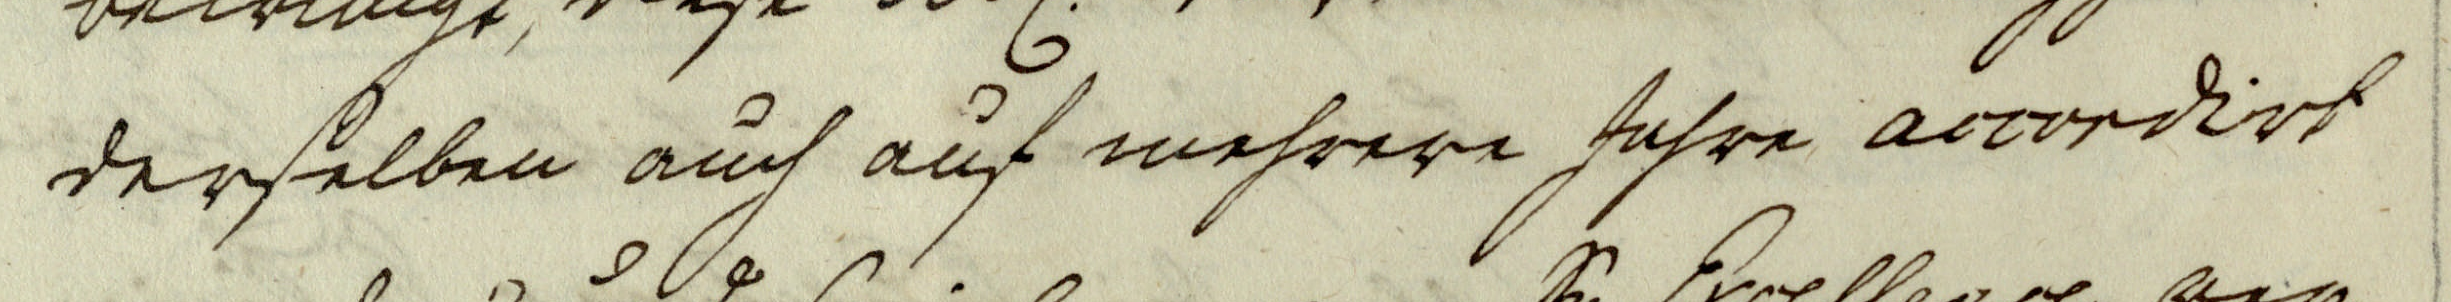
derselben auch auf mehrer jahre accordirt
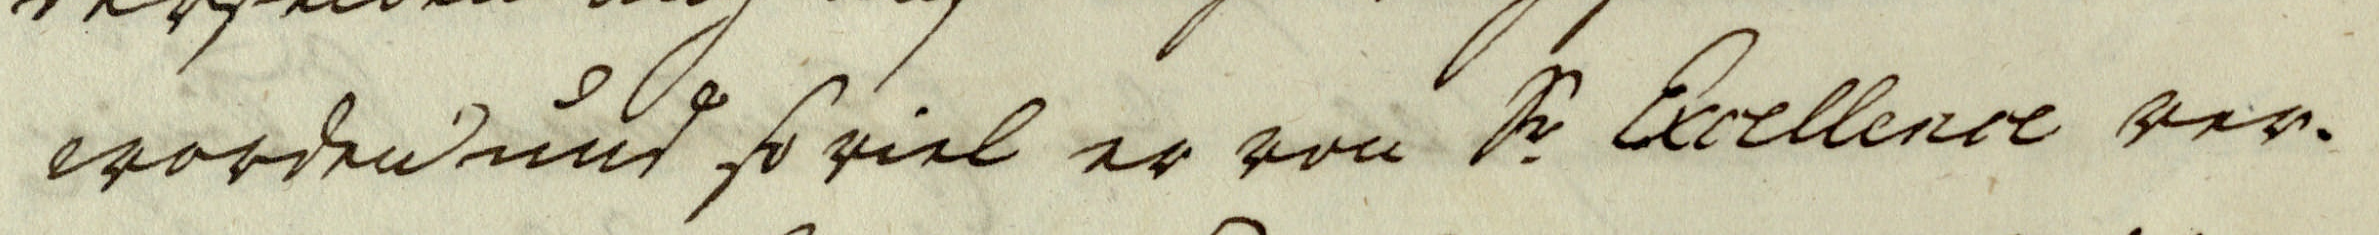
worden und so viel er von Sr. Excellence ver¬
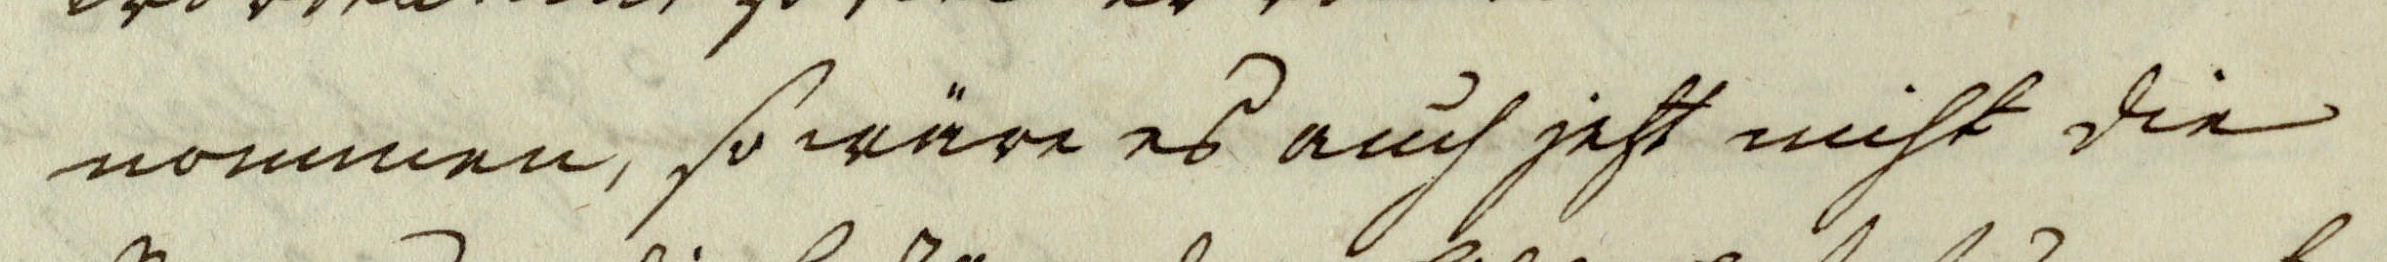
nommen, so wäre es auch jetzt nicht die
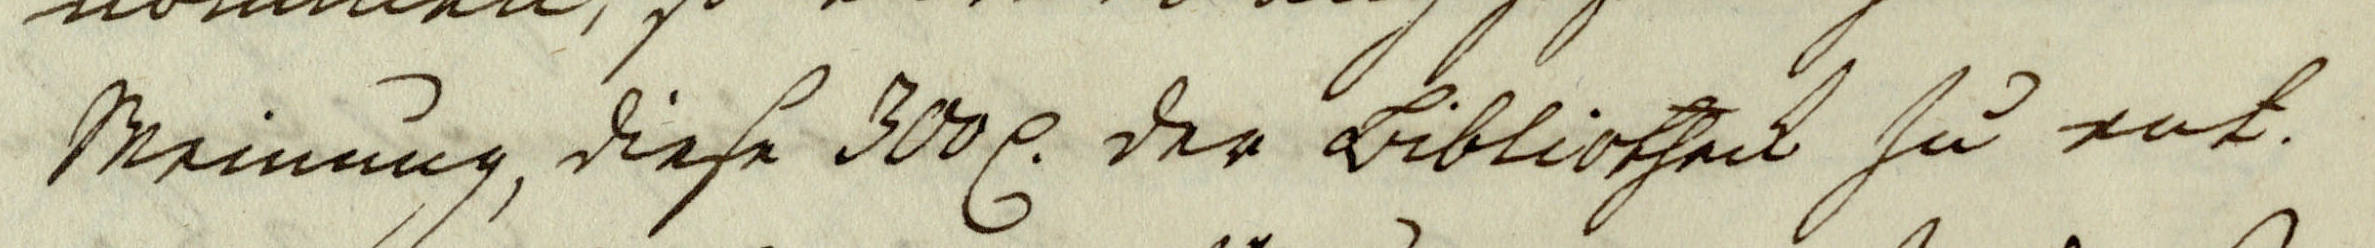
Meinung, diese 300 rtl. der Bibliothek zu ent¬
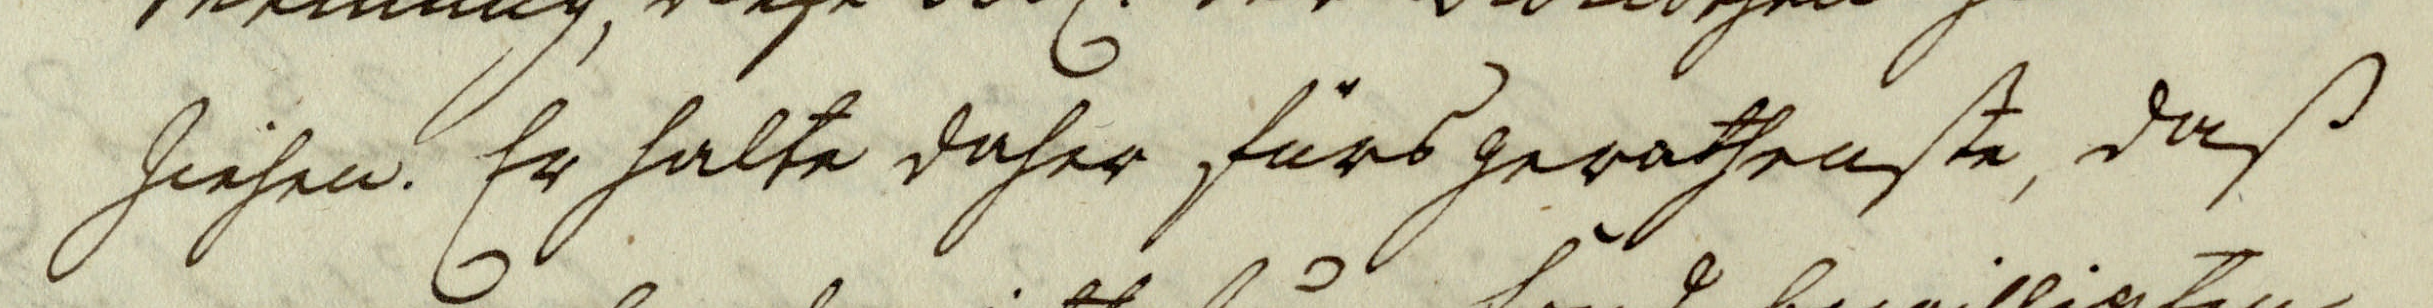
ziehen. Er halte daher fürs gerathenste, daß
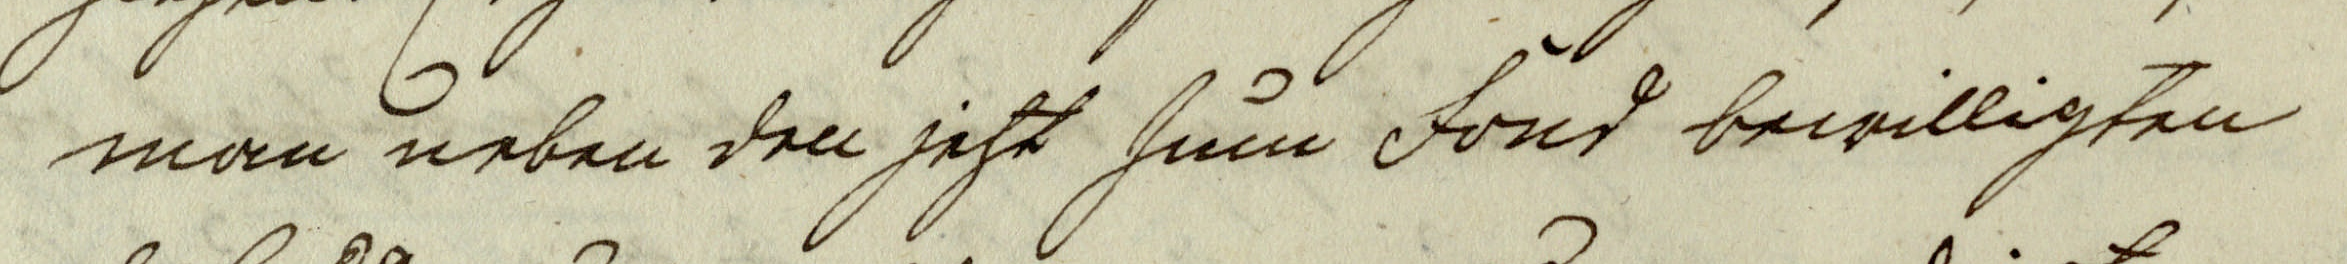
man neben den jetzt zum Fond bewilligten
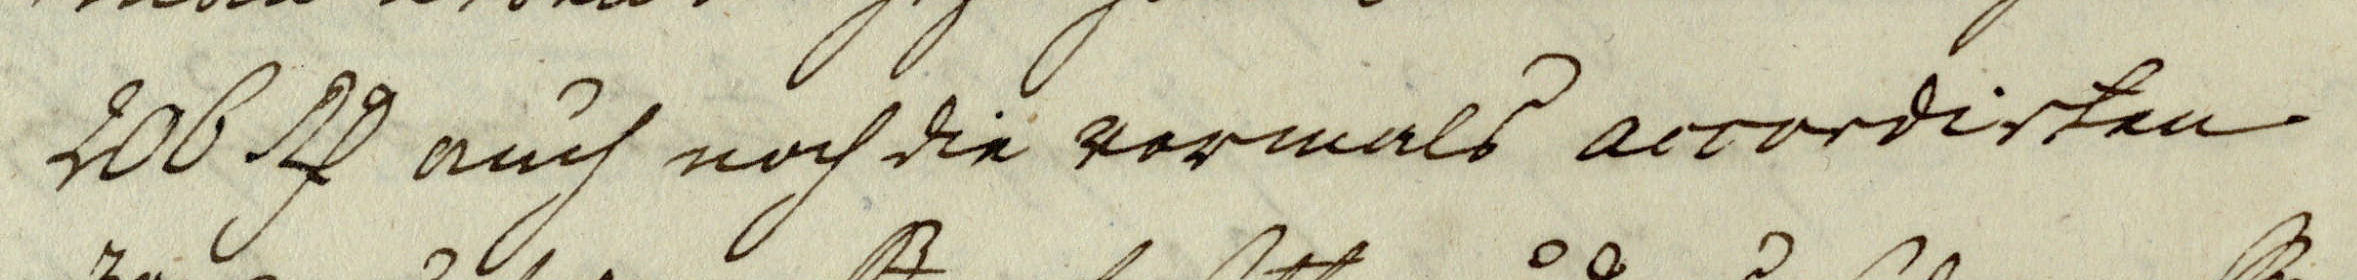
200 rtl auch noch die vormals accordirten
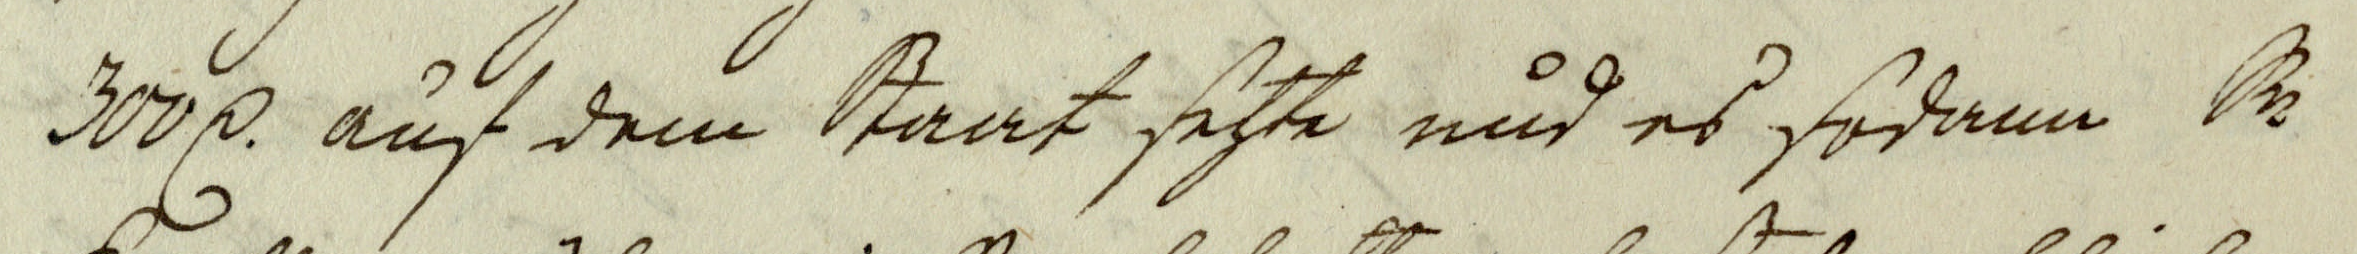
300 rtl. auf dem Staat setzte und es sodann Sr.
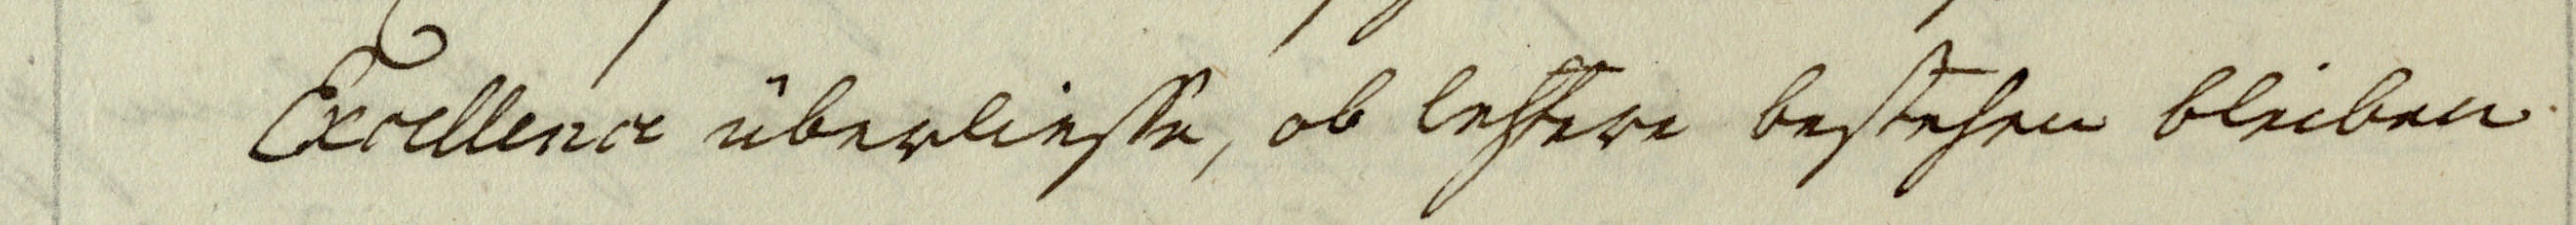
Excellence überliesse, ob letztere bestehen bleiben
